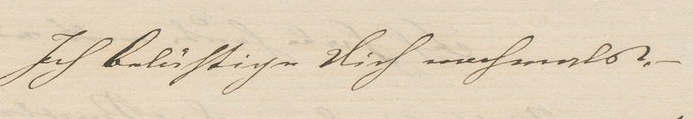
Ich belästige Dich nochmals. –
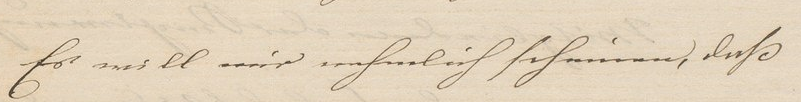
Es will mir nehmlich scheinen, daß
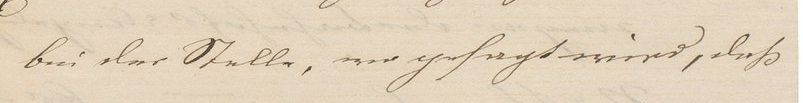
bei der Stelle, wo gesagt wird, daß
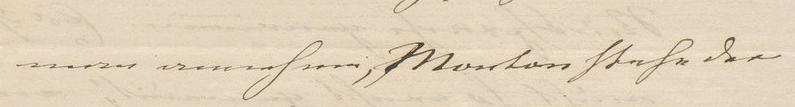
man annehme, Mouton stehe der
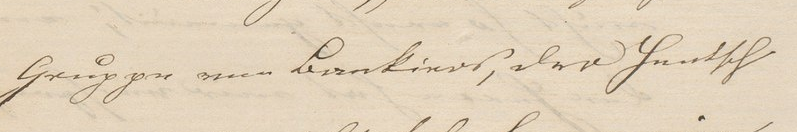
Gruppe von Bankiers, der Hentsch
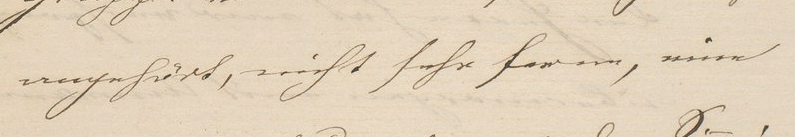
angeführt, nicht sehr ferne, eine
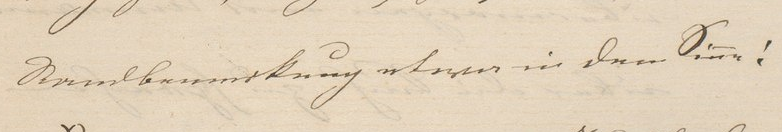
Randbemerkung etwa in dem Sinn:
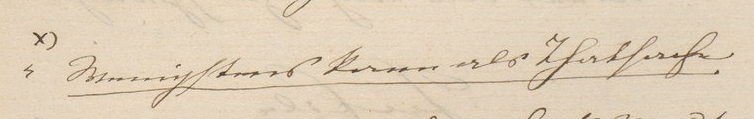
x) «Wenigstens kann als Thatsache
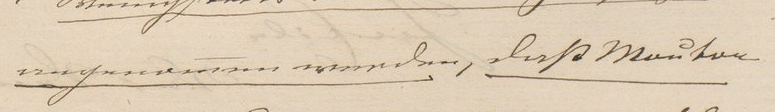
angenommen werden, daß Mouton
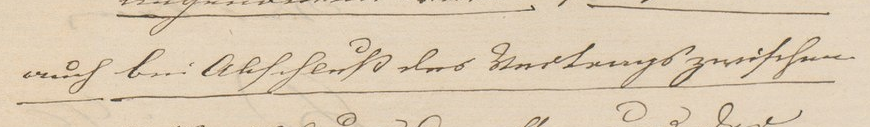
auch bei Abschluß des Vertrags zwischen
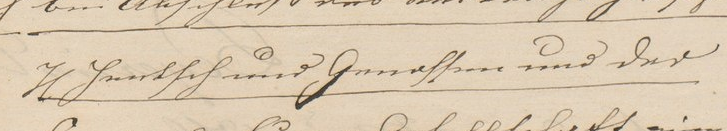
H Hentsch und Genossen und der
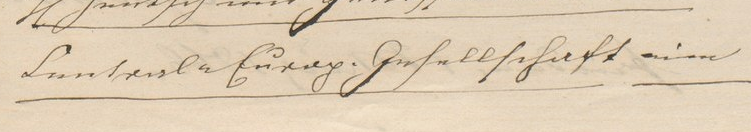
Central-Europ. Gesellschaft eine
